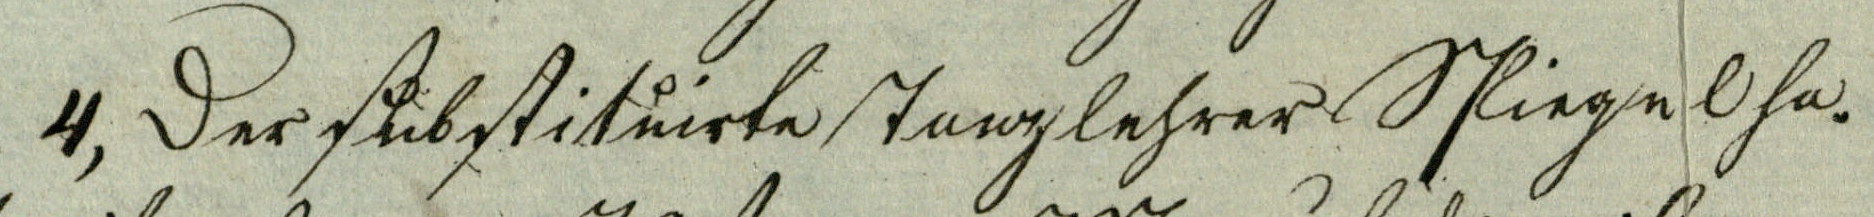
4, Der substituirte Tanzlehrer Spiegel ha¬
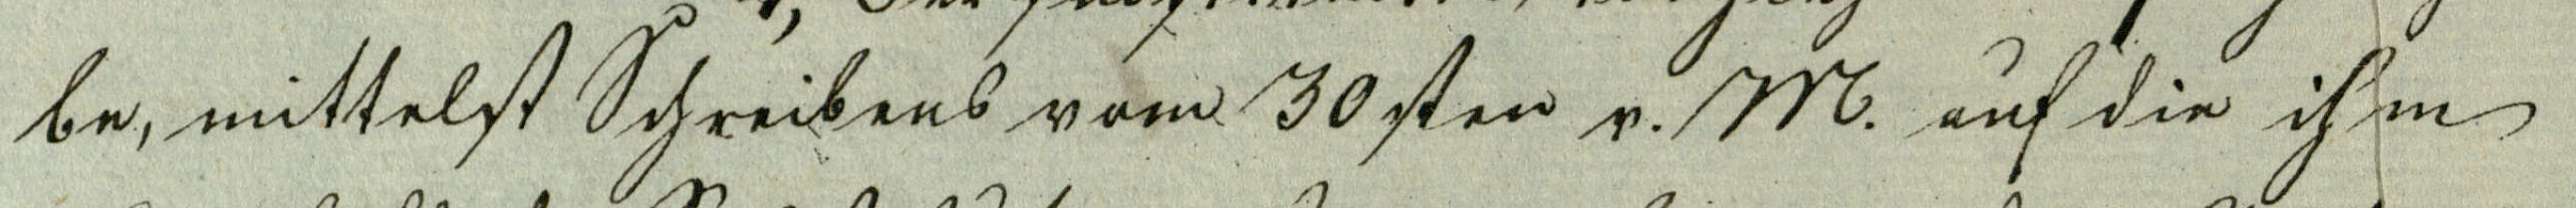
be, mittelst Schreibens vom 30ten v. M. auf die ihm
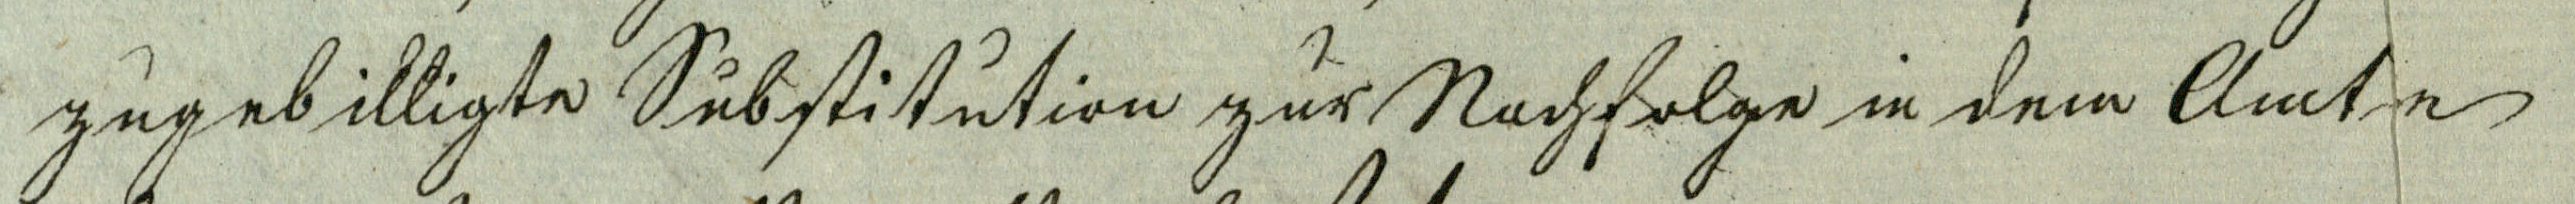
zugebilligte Substitution zur Nachfolge in dem Amte
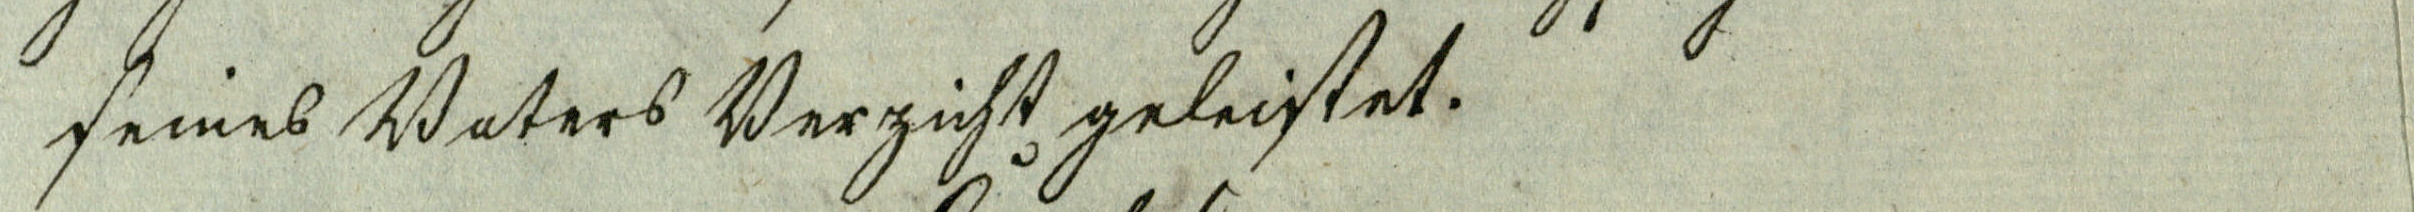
seines Vaters Verzicht geleistet.
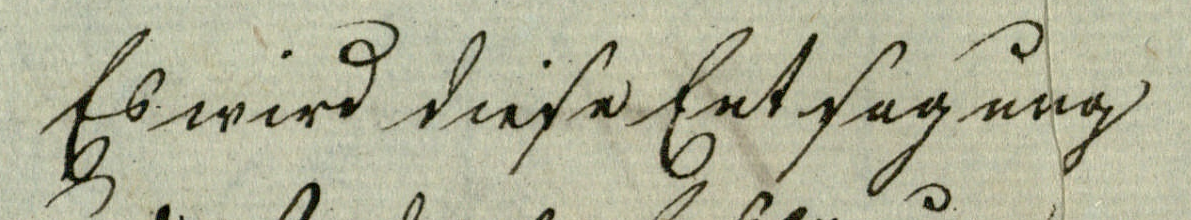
Es wird diese Entsagung
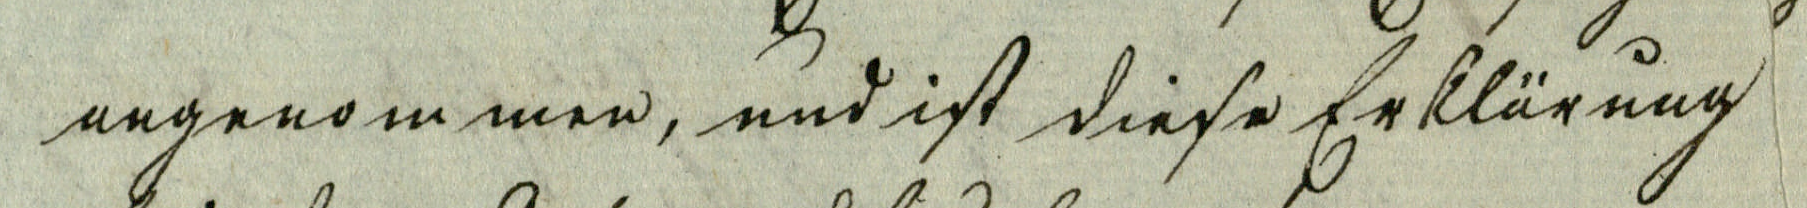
angenommen, und ist diese Erklärung
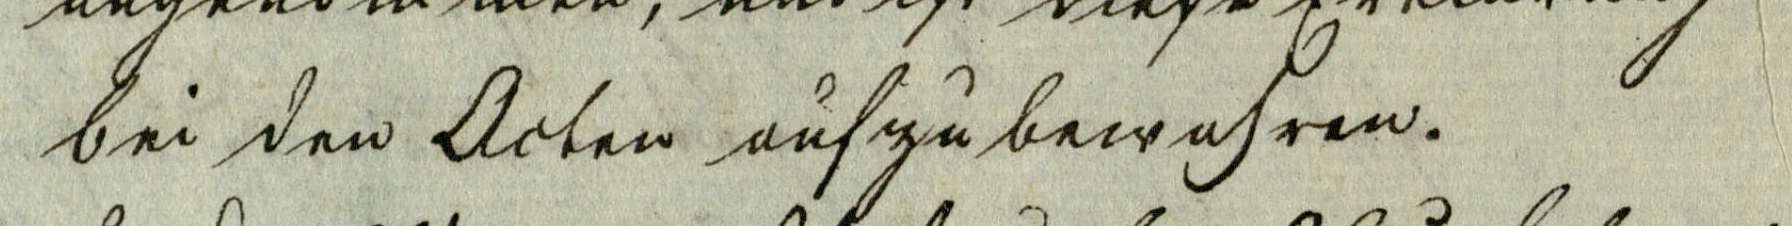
bei den Acten aufzubewahren.
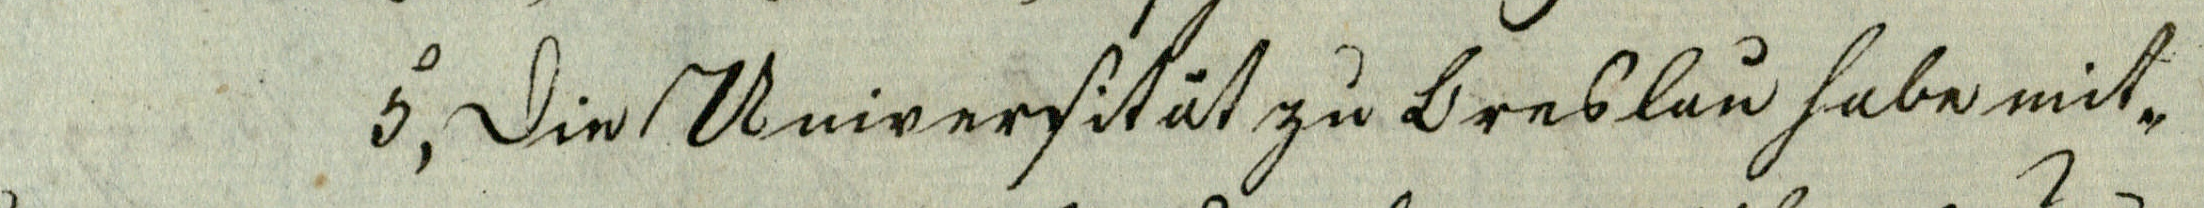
5, Die Universität zu Breslau habe mit¬
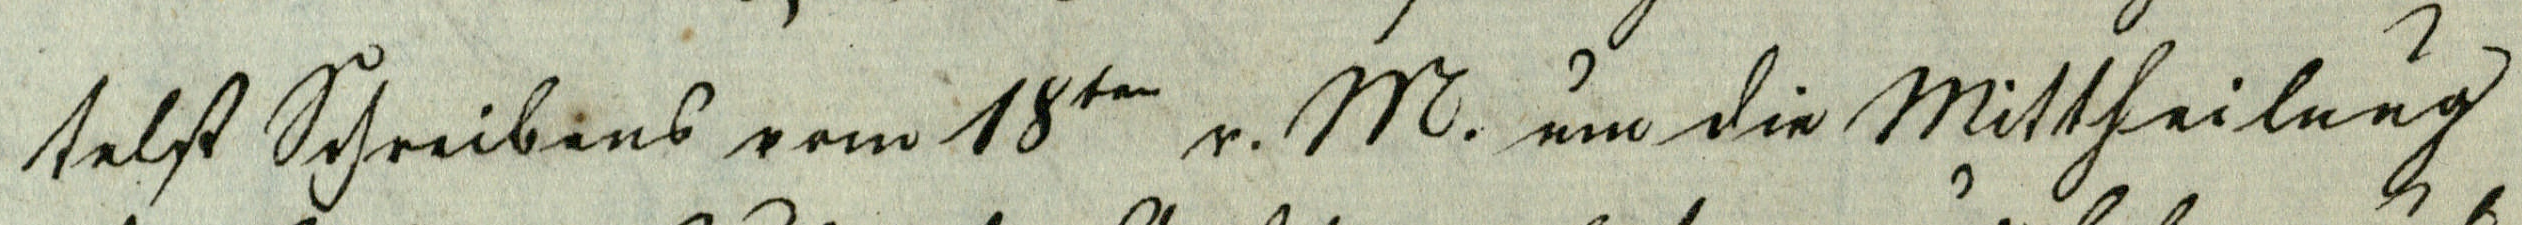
telst Schreibens vom 18ten v. M. um die Mitteilung
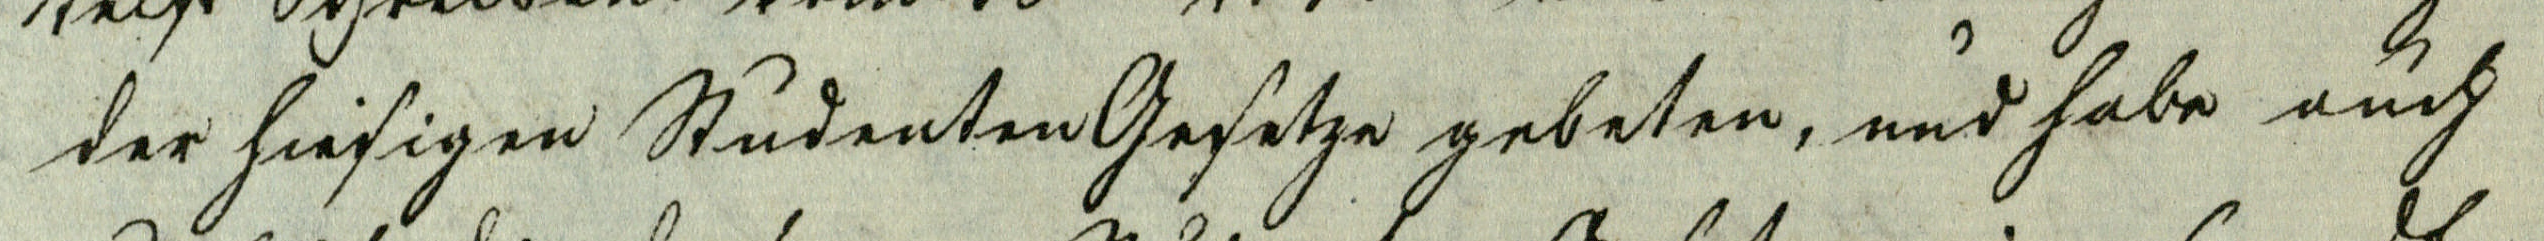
der hiesigen StudentenGesetze gebeten, und habe auch
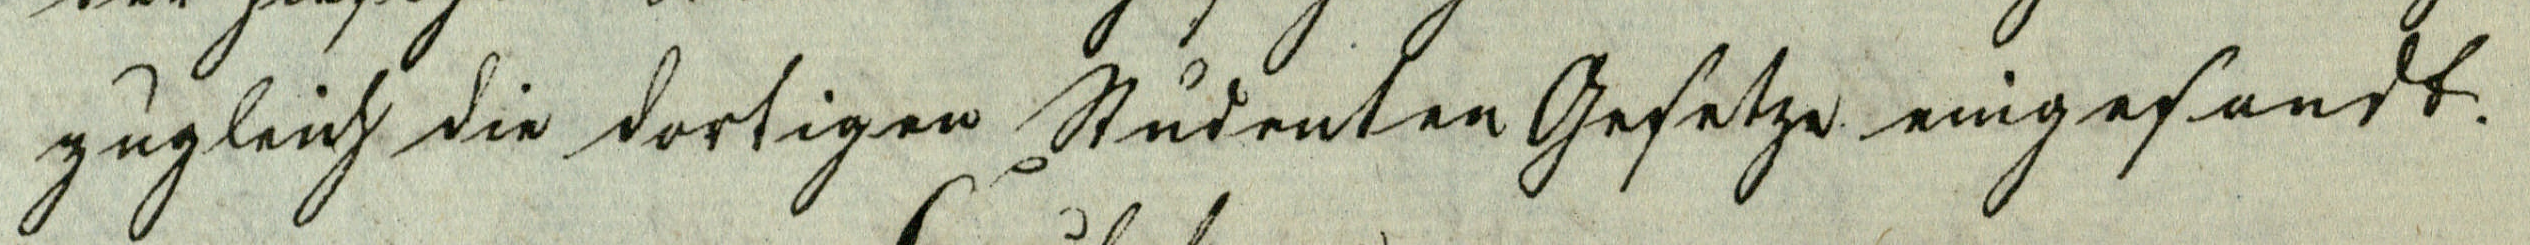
zugleich die dortigen Studenten Gesetzte eingesandt.
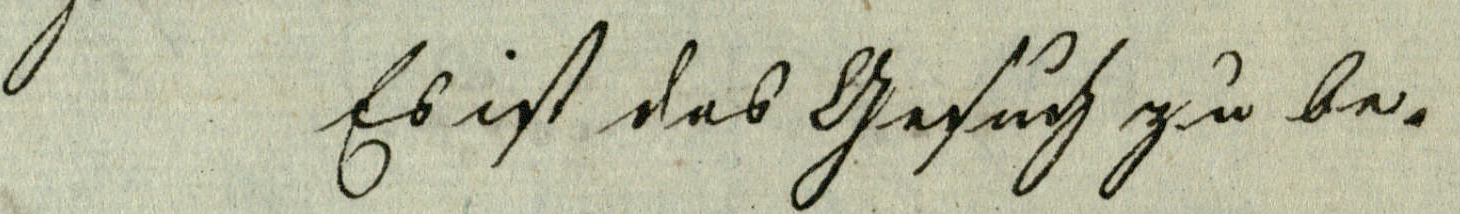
Es ist das Gesuch zu be¬
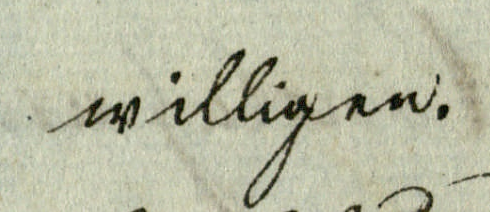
willigen.
